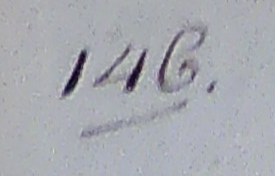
146.
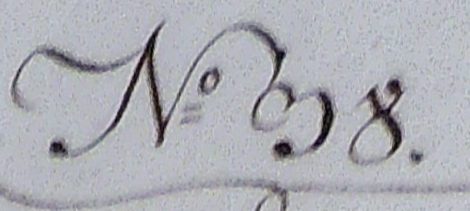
No͇ 38.
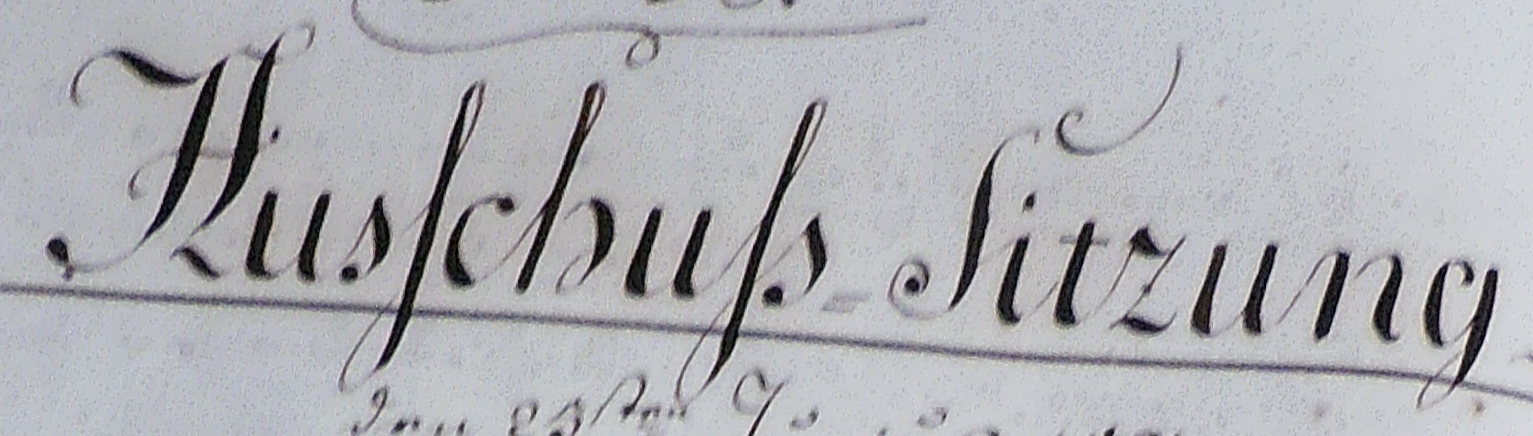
Ausschuss‗Sitzung
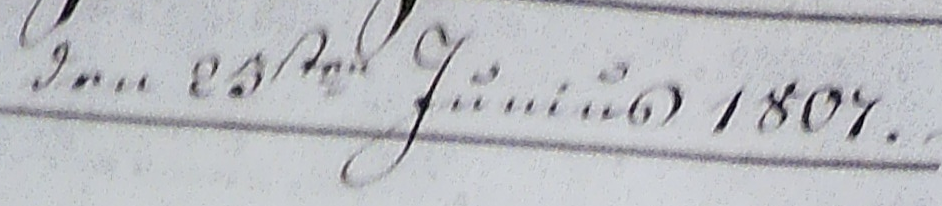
den 23ste͇n Junius 1807.
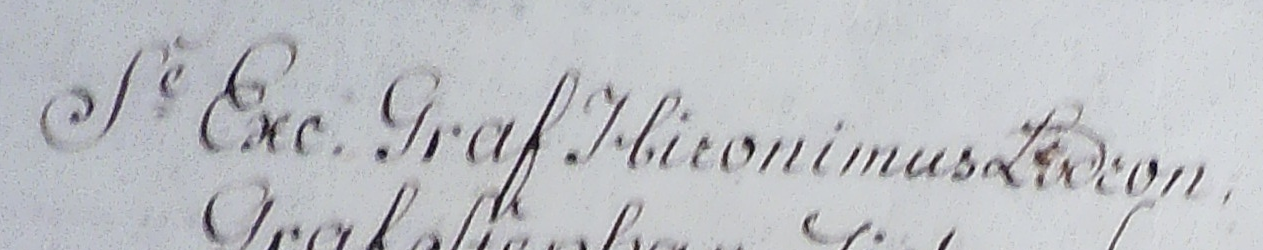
Se͇ Exc. Graf Hironimus Lodron
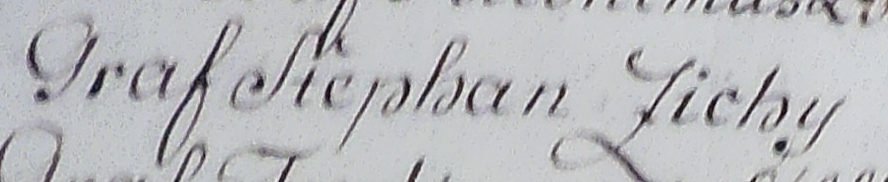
Graf Stephan Zichy
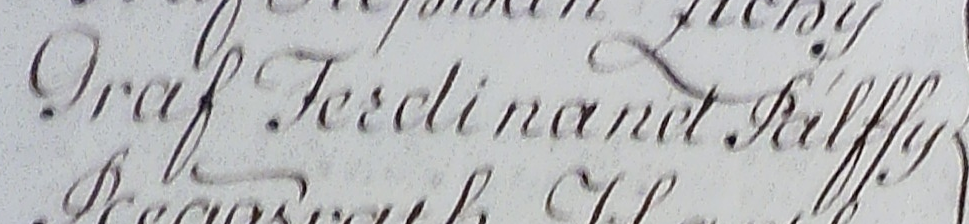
Graf Ferdinand Pálffy
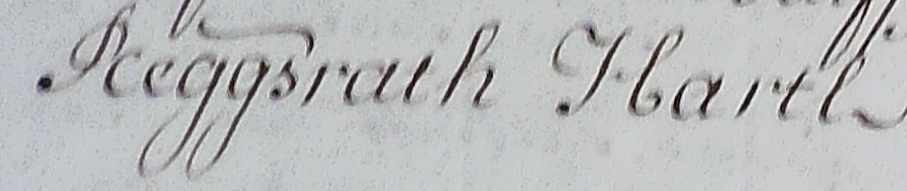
Reg͞gsrath Hartl.
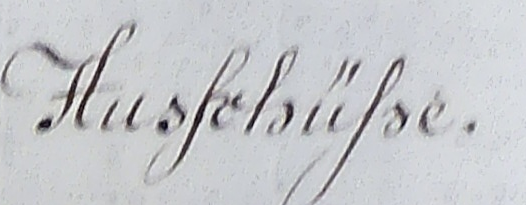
Ausschchüsse.
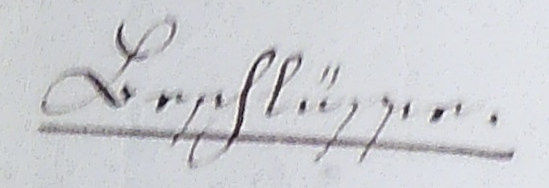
Beschlüsse.
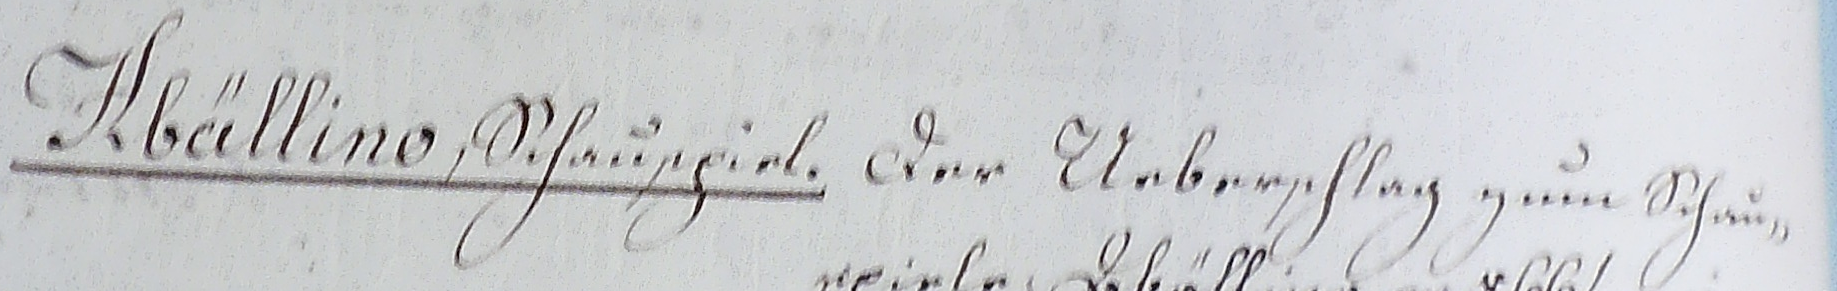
Abällino, Schauspiel. Der Ueberschlag zum Schau¬
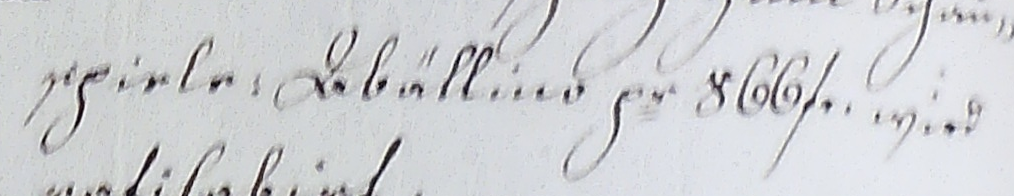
spiele, Abällino pr͇ 866fr. wird
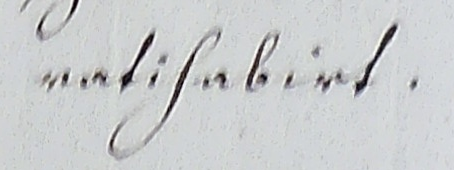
ratihabirt.
